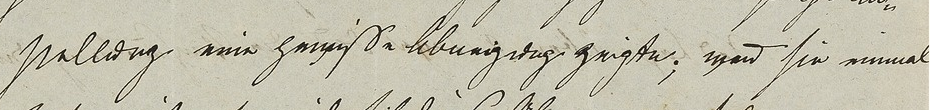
stellung eine gewisse Abneigung zeigte; wenn sie einmal
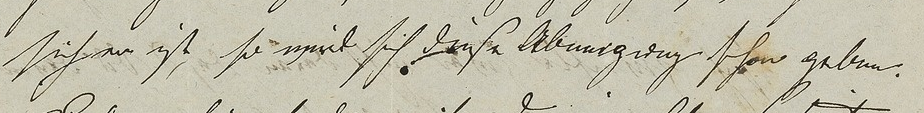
sicher ist, so wird sich diese Abneigung schon geben.
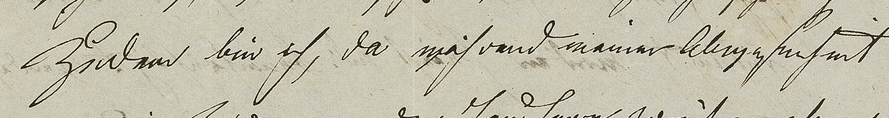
Zudem bin ich, da während meiner Abwesenheit
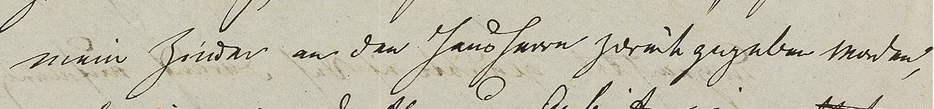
mein Zimmer an den Hausherrn zurückgegeben worden,
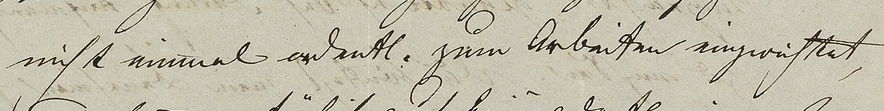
nicht einmal ordentl. zum Arbeiten eingerichtet,
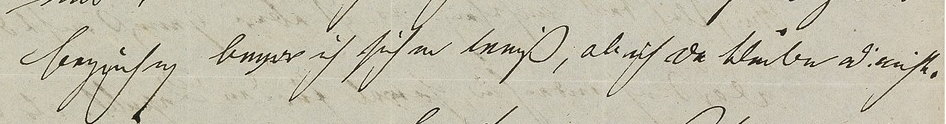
beziehen bevor ich sicher weiß, ob ich da bleibe od: nicht.
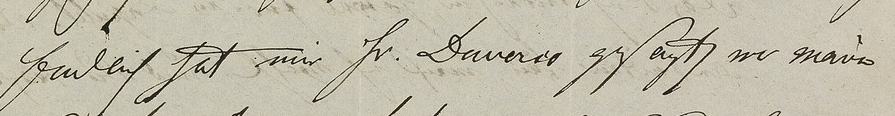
Endlich hat mir Hr. Daverio gesagt, er wäre
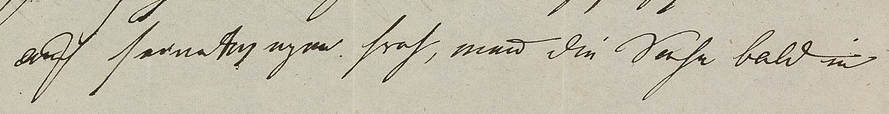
auch seinetwegen froh, wenn die Sache bald in
